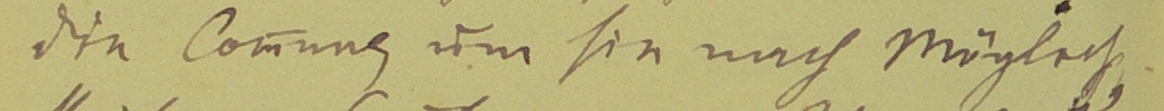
die Commune um sie nach Möglich¬
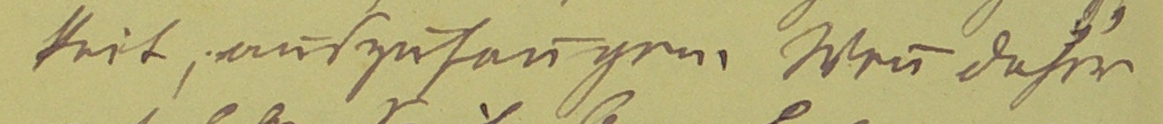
keit auszusaugen. Wenn daher
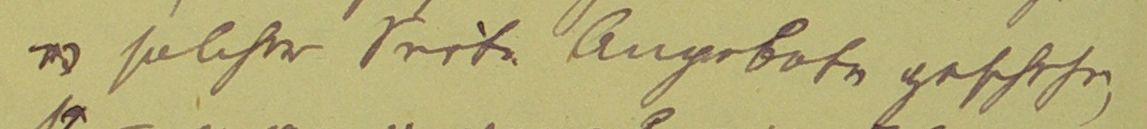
von solcher Seite Angebote geschehen
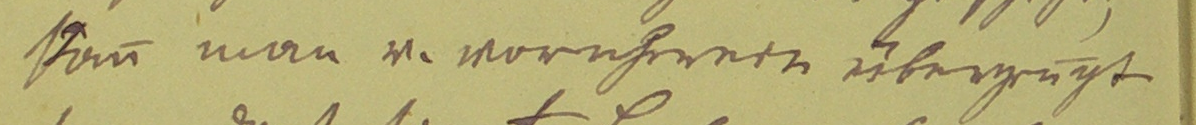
kann man von vornherein überzeugt
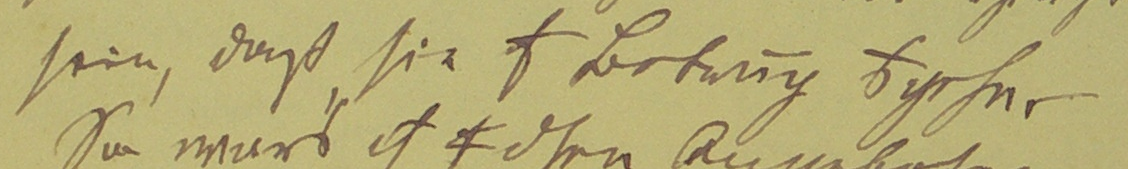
sein, daß sie mit Betrug mitgehen.-
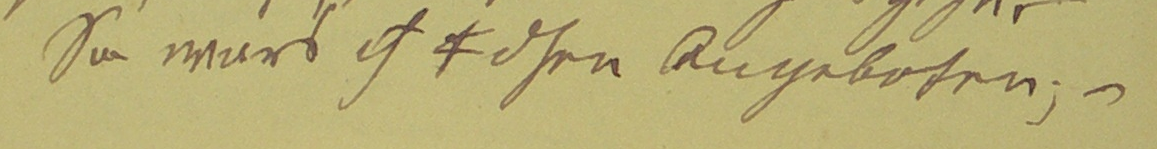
So war´s mit diesen Angeboten;--
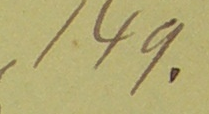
149
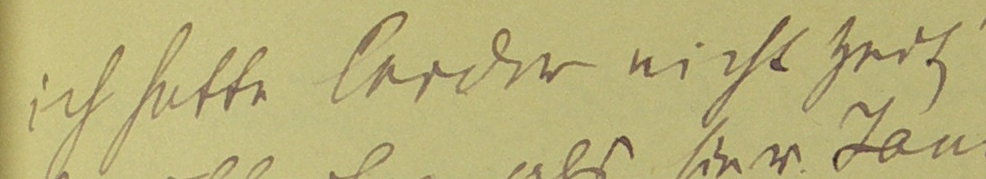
Ich hatte leider nicht Zeit
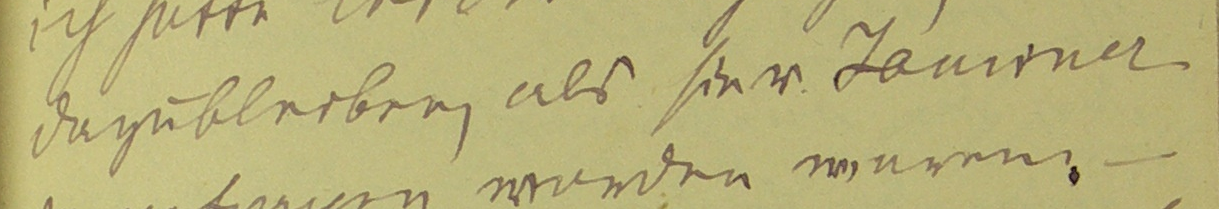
dazubleiben, als sie von Tanierer
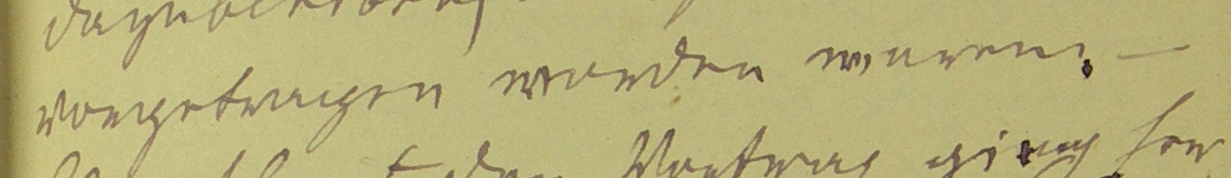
vorgetragen worden waren.—
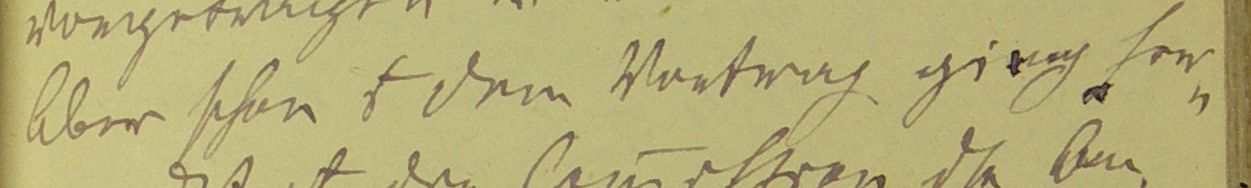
Aber schon mit dem Vortrag ging her¬
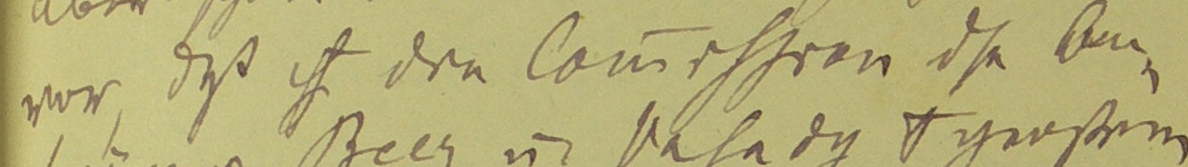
vor , daß auch die Commission diese An¬
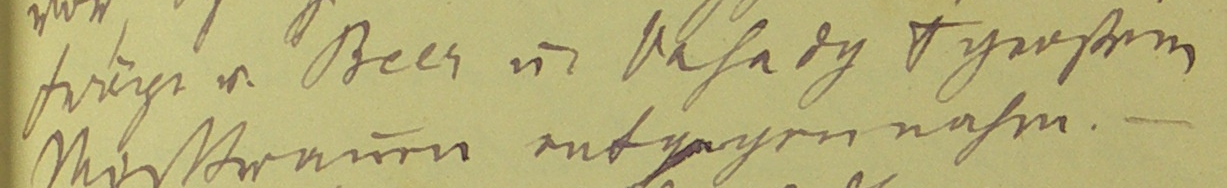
träge von Beer und Vahady mit großem
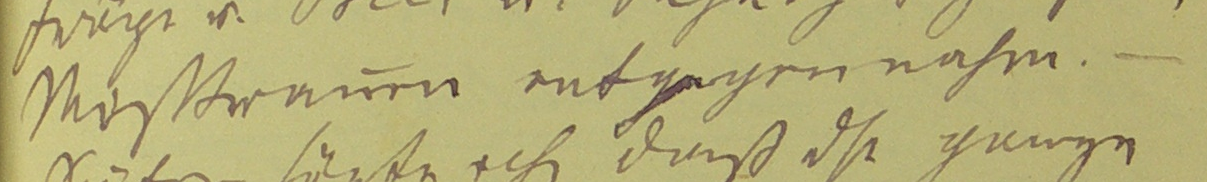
Mistrauen entgegen nahm.-
